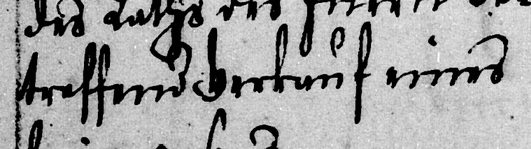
treffend Verkauf eines
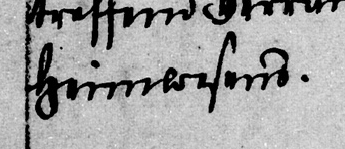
Heimwesens.
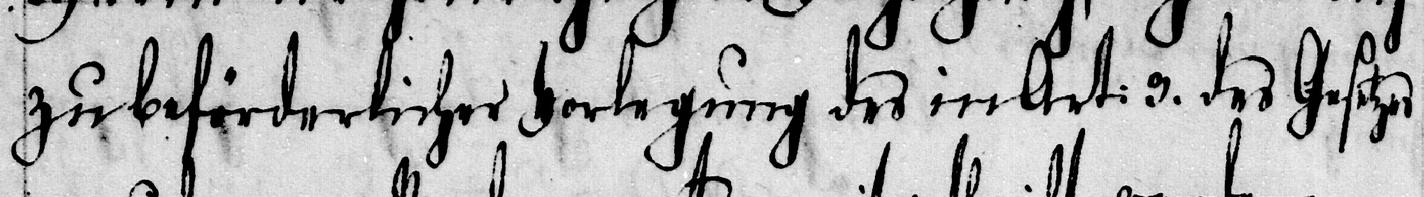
zu beförderlicher Vorlegung des in Art: 3. des Geset¬
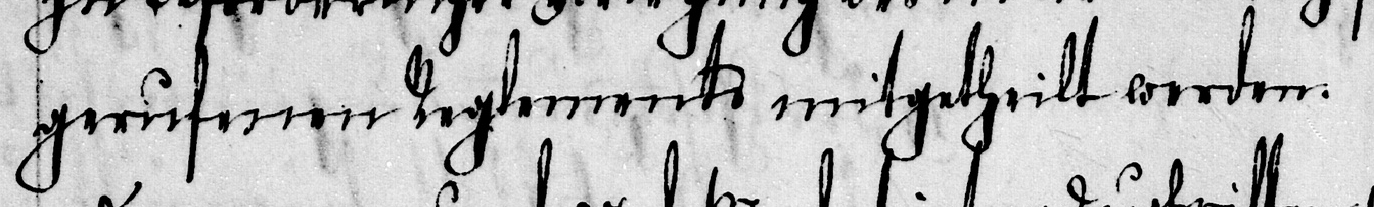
gerufenen Reglements mitgetheilt werden.
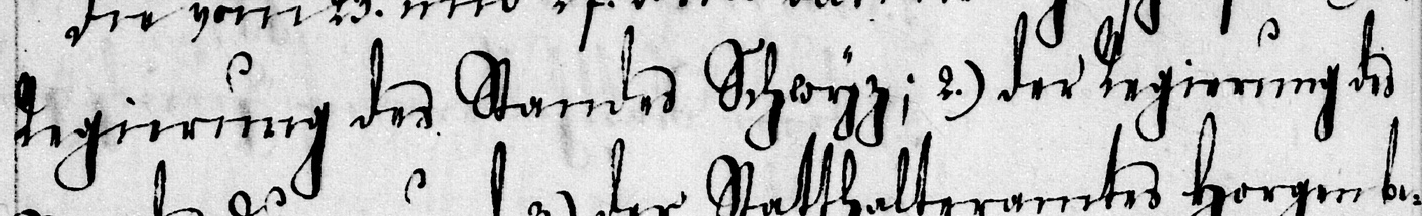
Regierung des Standes Schwyz; 2.) der Regierung des
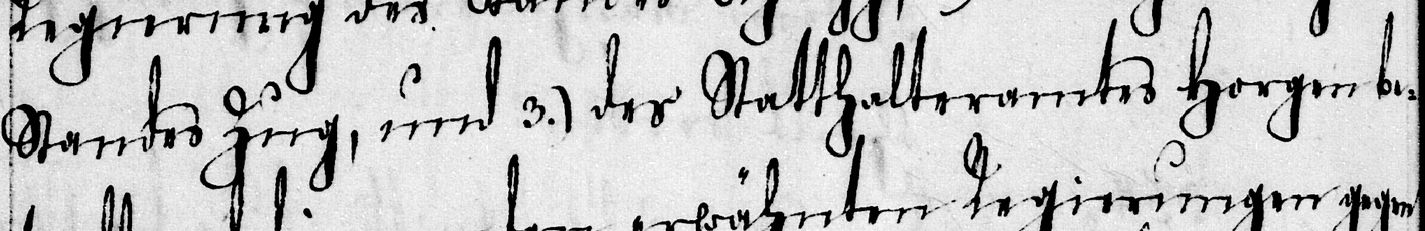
Standes Zug, und 3.) des Statthalteramtes Horgen b¬
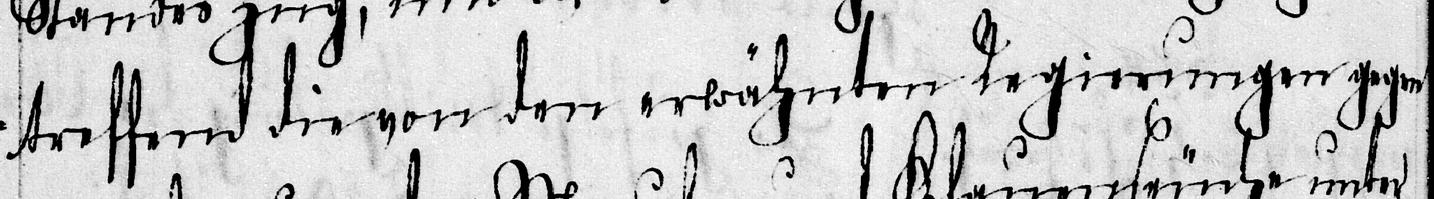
etreffend die von den erwähnten Regierungen gegen
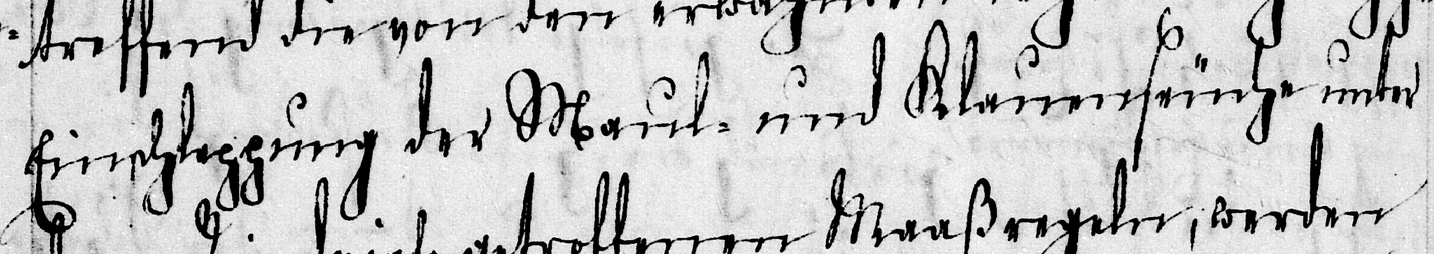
Einschleppung der Maul- und Klauenseuche unter
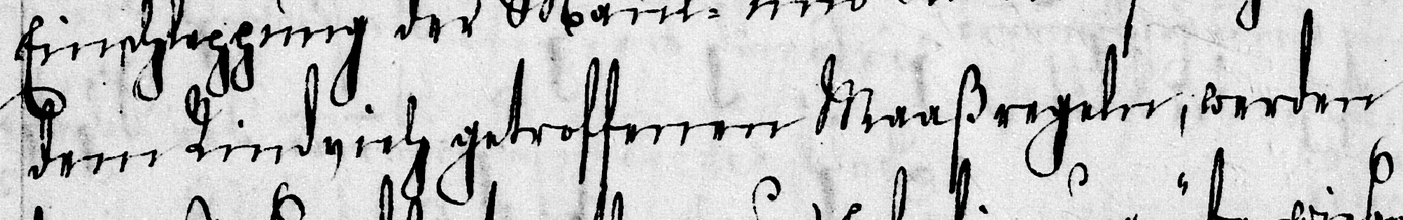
dem Rindvieh getroffenen Maaßregeln, werden
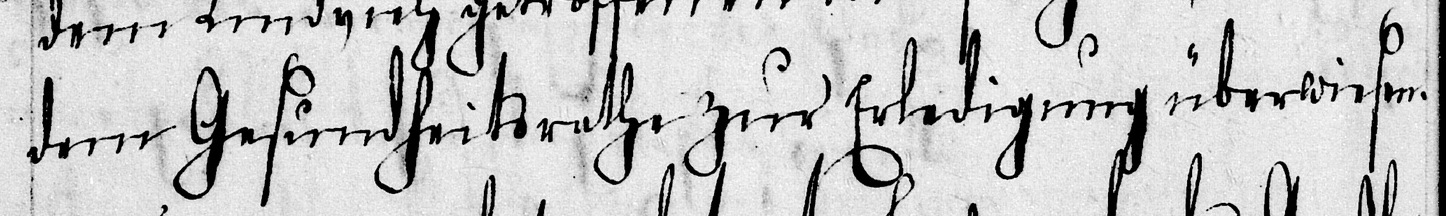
dem Gesundheitsrathe zur Erledigung überwiesen.
